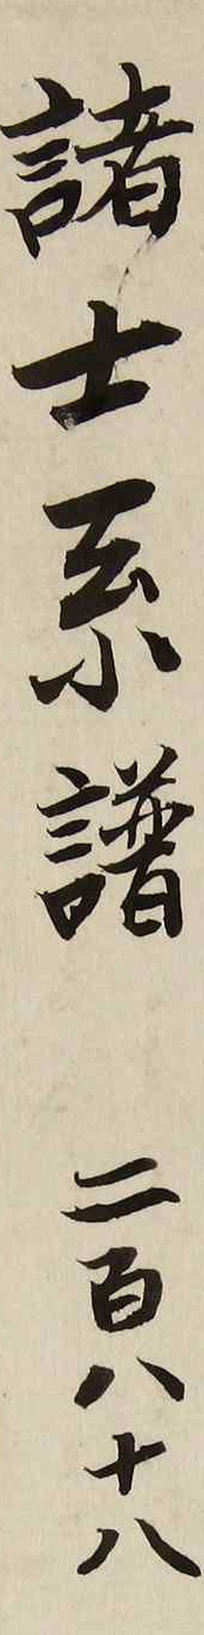諸士系譜二百八十八

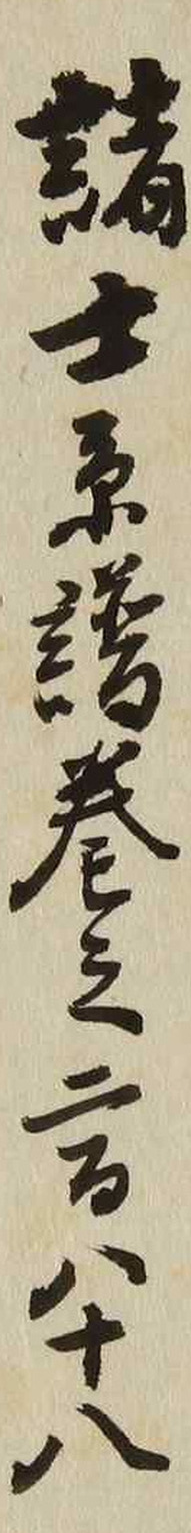諸士系譜巻之二百八十八
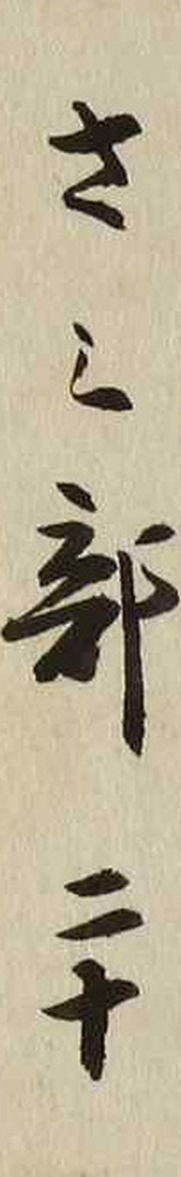さ之部二十
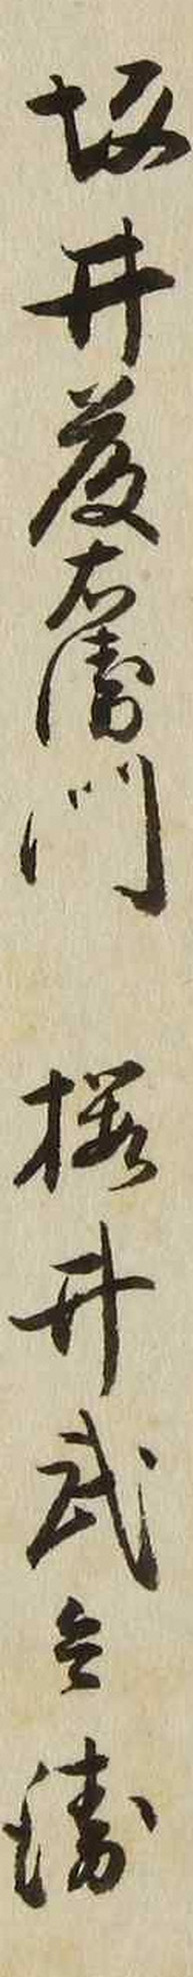坂井藤右衛門桜井武兵衛
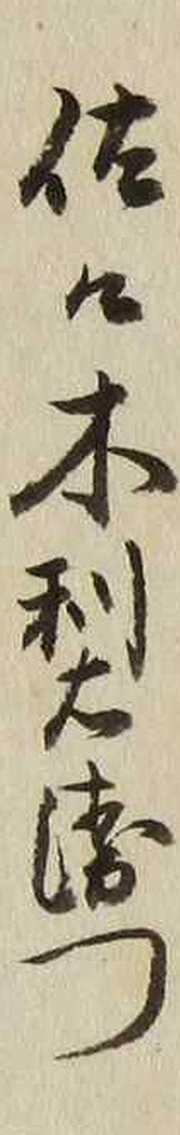佐々木利右衛門

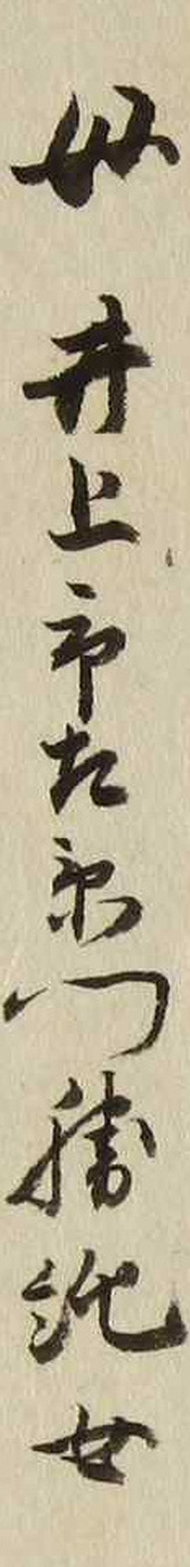母井上市左衛門勝純女
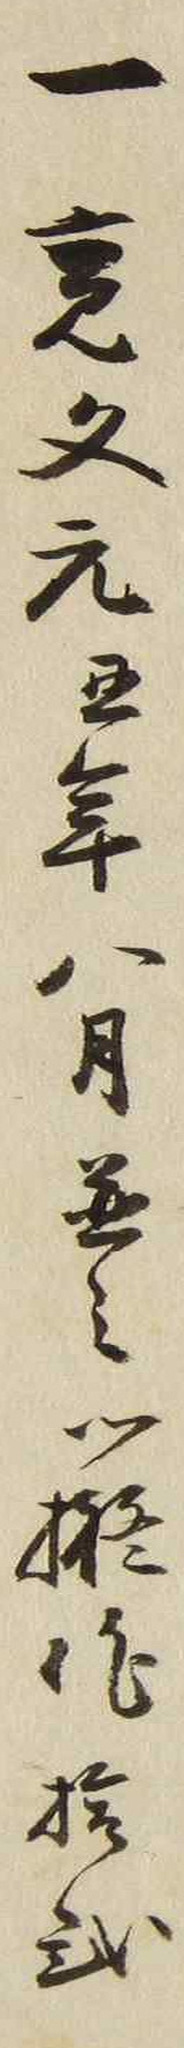一寛文元丑年八月並之御擬作拾弐

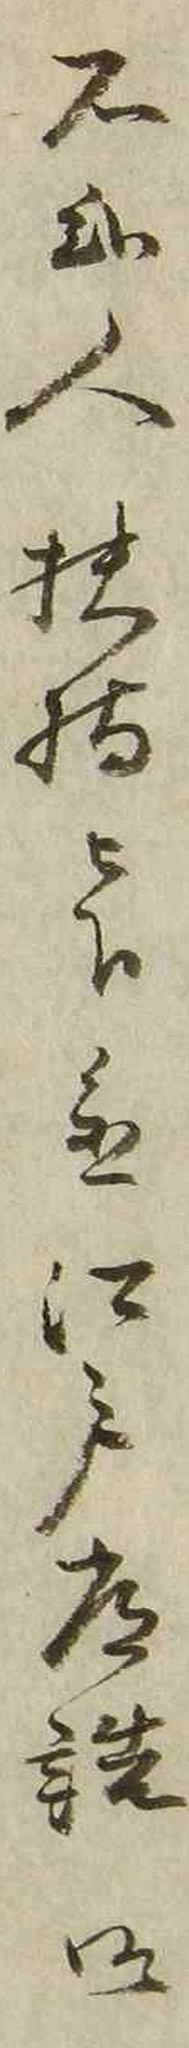石弐人扶持被下置江戸常詰御
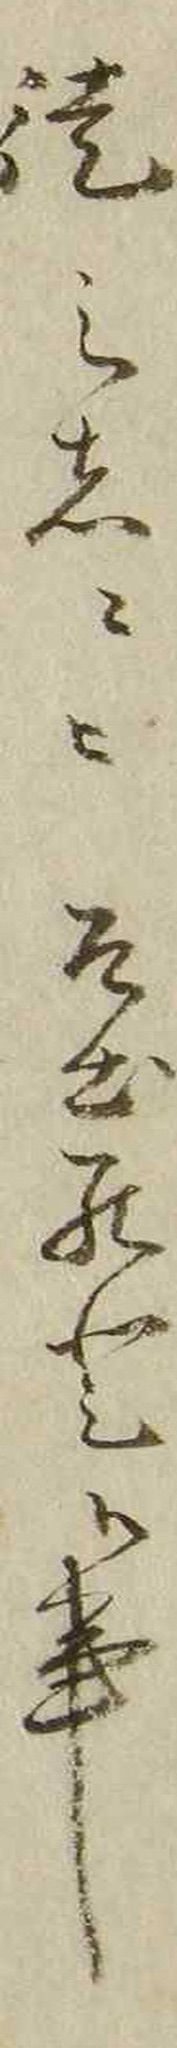徒之者ニ被召出罷登候事
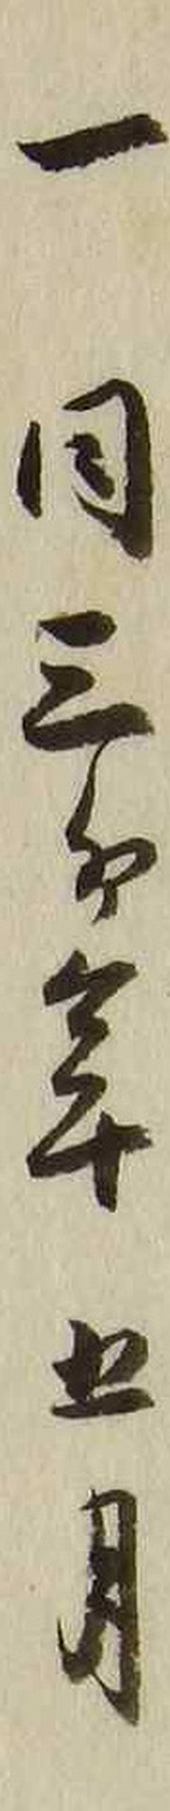一同三卯年五月
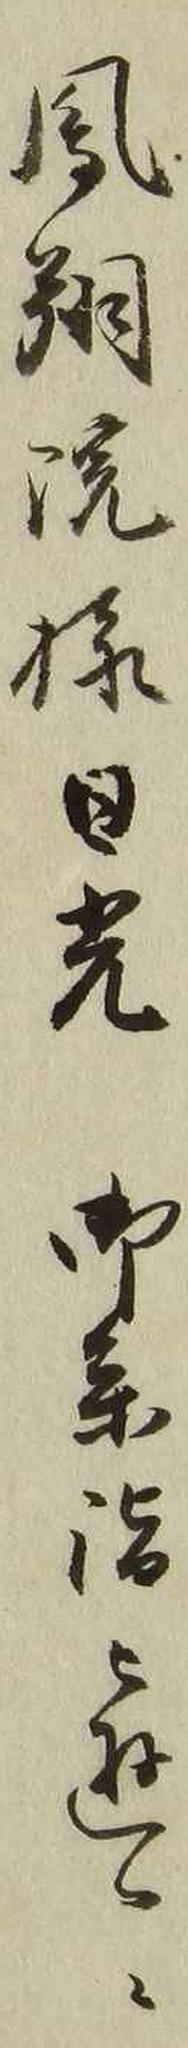鳳翔院様日光御参詣被遊候ニ
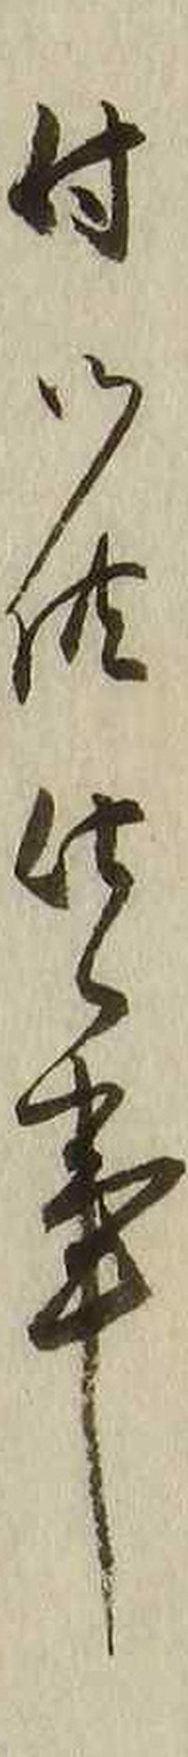付御供仕候事
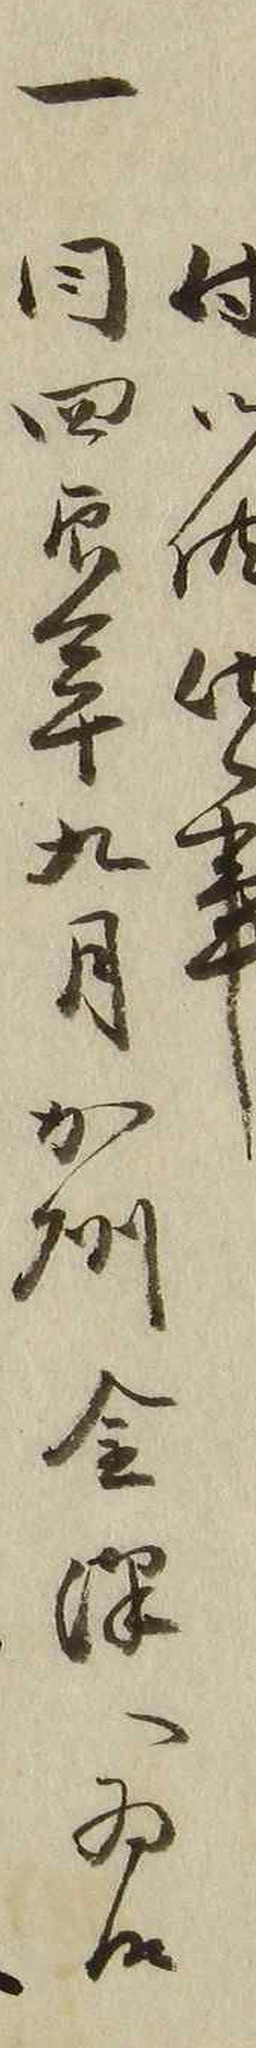一同四辰年九月加州金沢へ為御
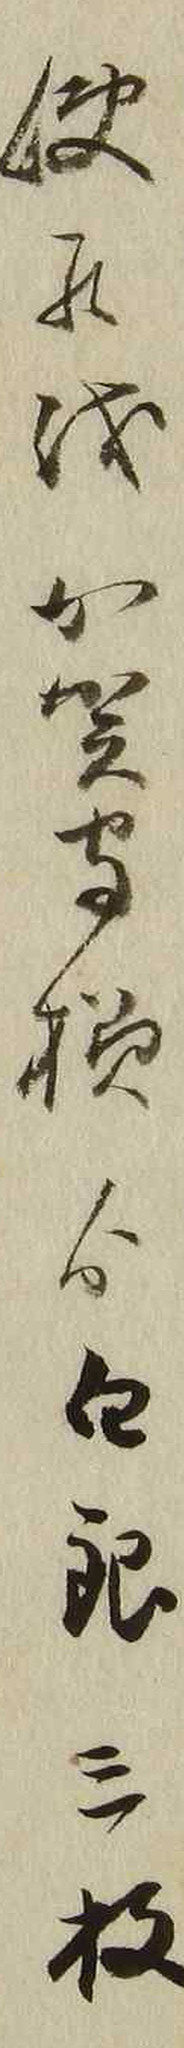使罷越加賀守様ゟ白銀三枚
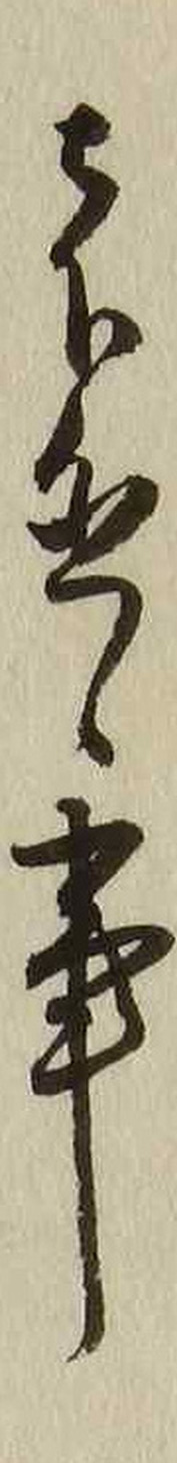被下置候事
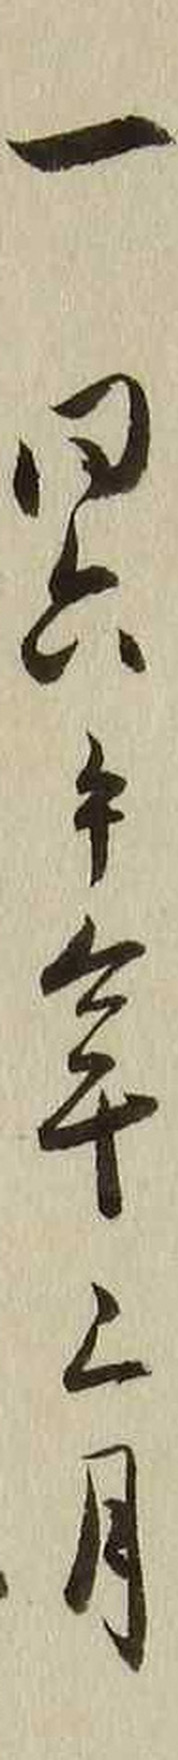一同六午年三月
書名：諸士系譜　巻之288　さ之部20
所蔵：会津若松市立会津図書館
